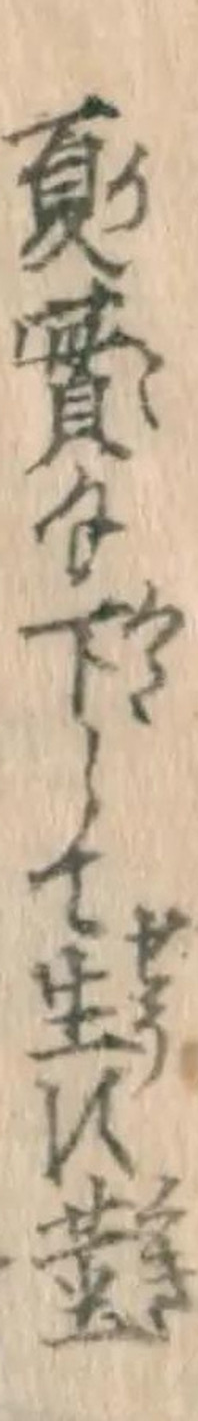夏実を下して生す茎
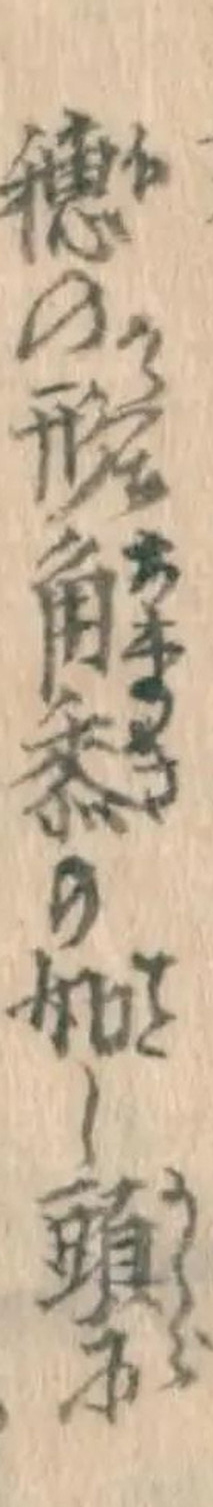穂の形角黍の如し頭に
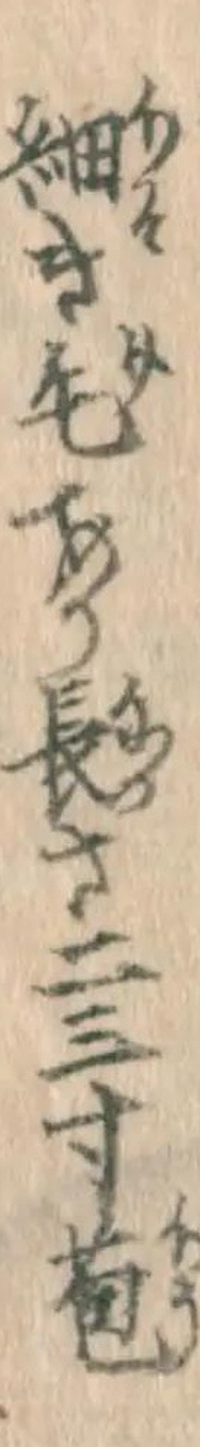細き毛あり長さ二三寸苞
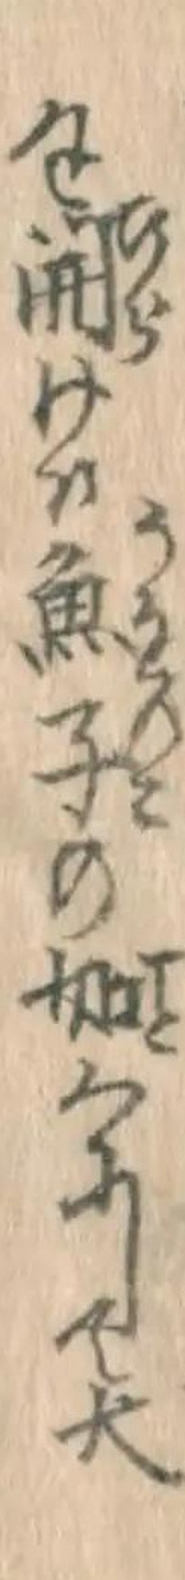を開けは魚子の如くにして大
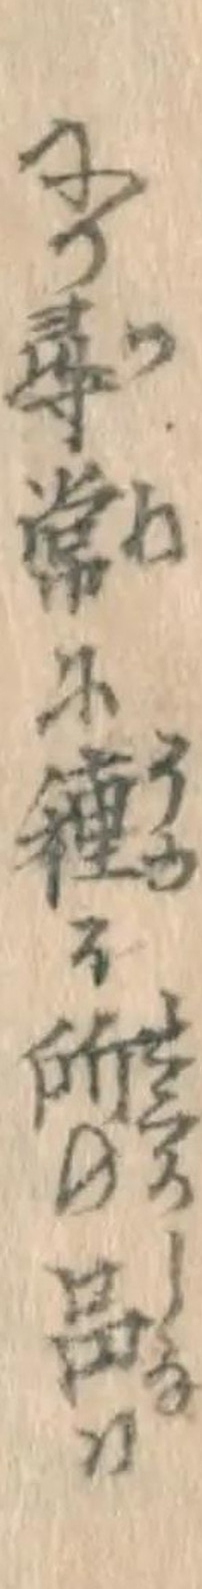なり尋常に種る所の品は
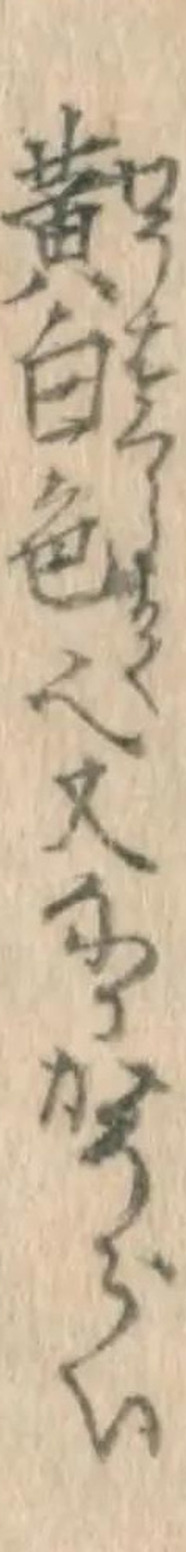黄白色也又なかかうらい
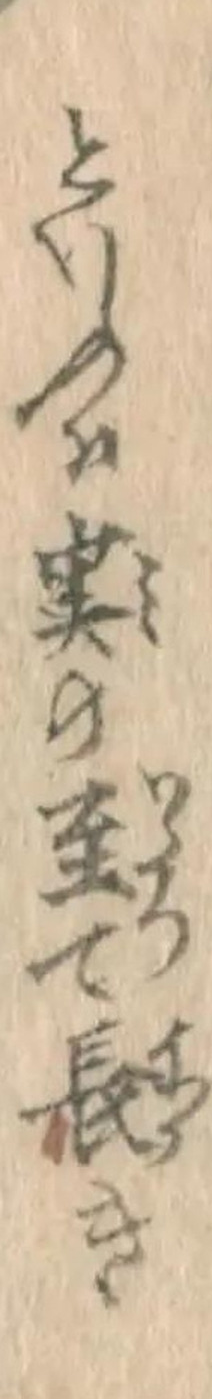といふは実の至て長き
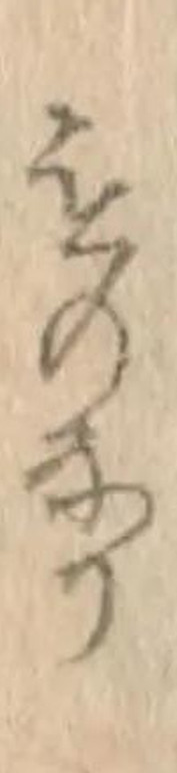ものなり

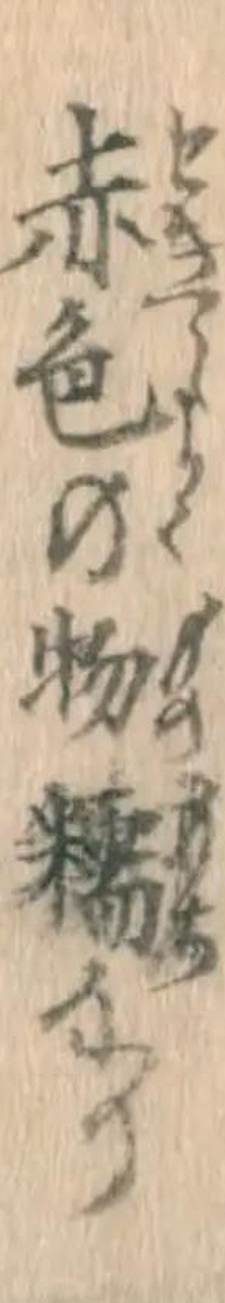一種赤色の物糯なり
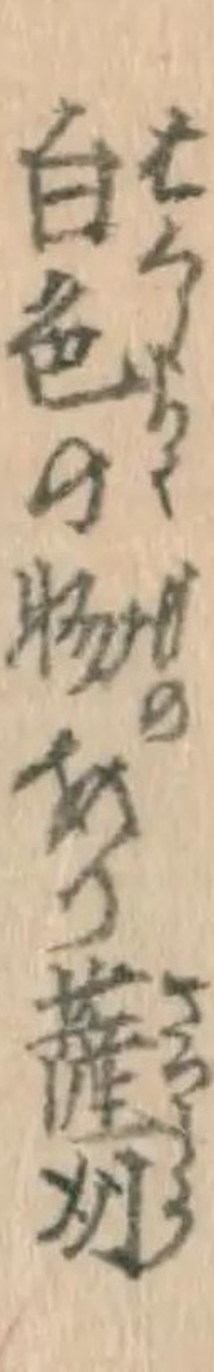白色の物あり薩州
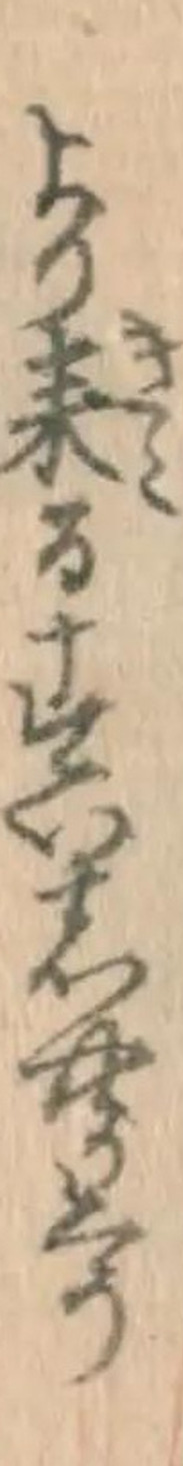より来るすいしやうとう
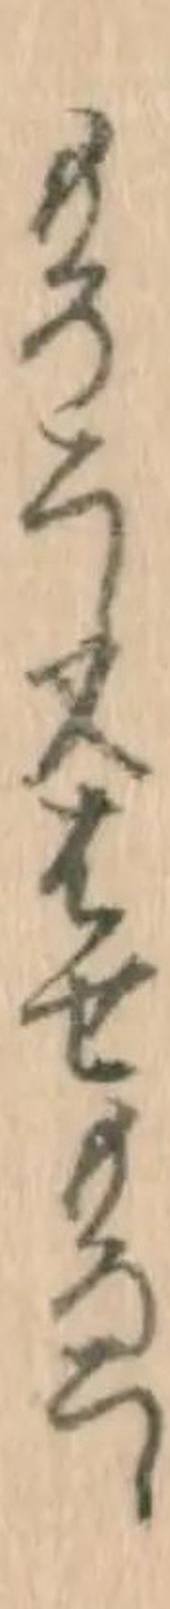もろこし又はせもろこし
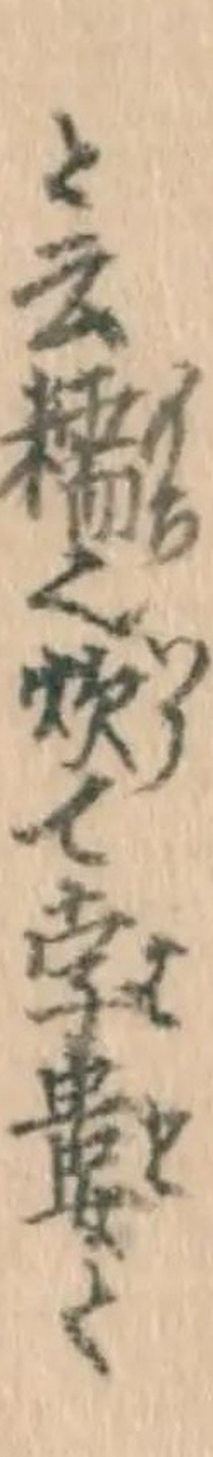と云糯也炊て孛婁と
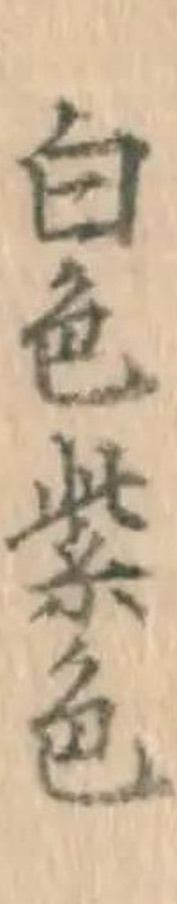白色紫色
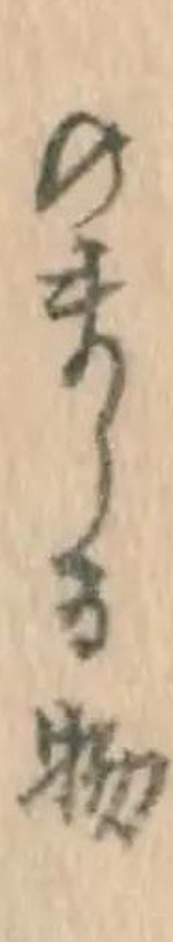のましる物
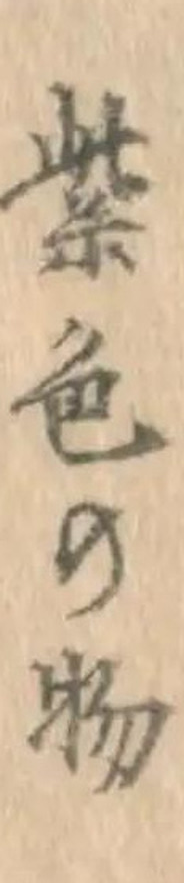紫色の物
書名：本草図譜. 巻40-42
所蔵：国立国会図書館 National Diet Library, JAPAN
